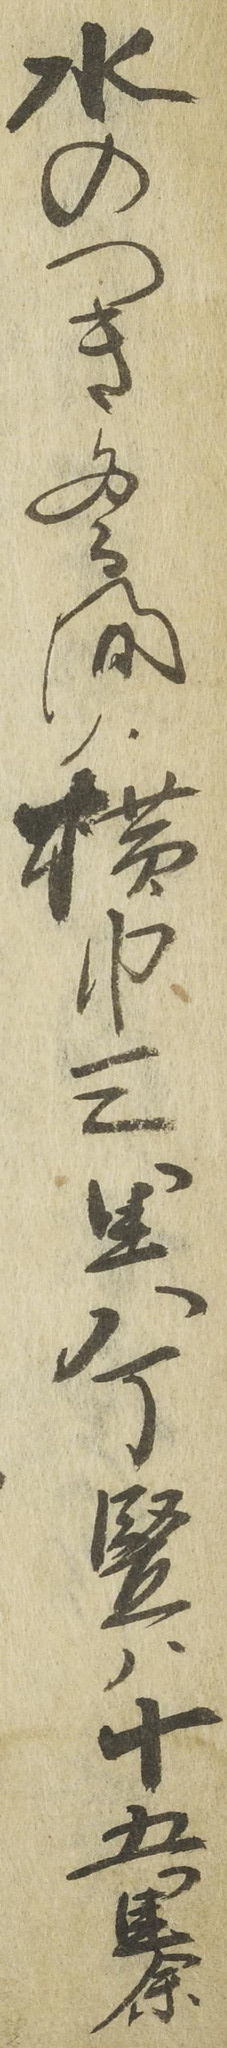水のつきたる間は横巾三里八丁竪は十五里余
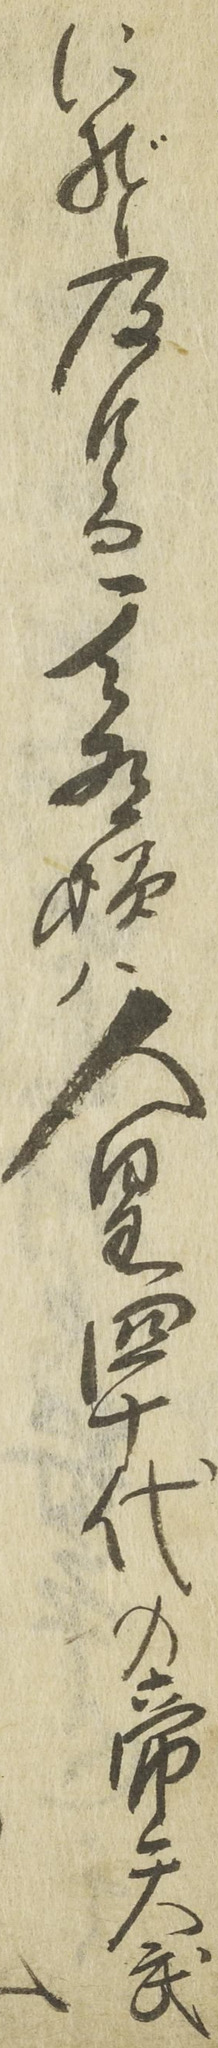にぞ及ける其有様は人皇四十代の帝天武
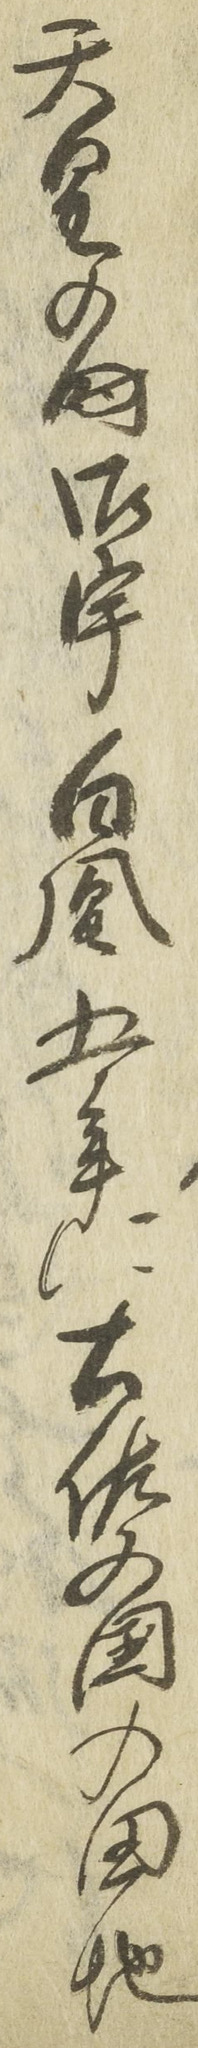天皇の時御宇白凰五年に土佐の国の田地
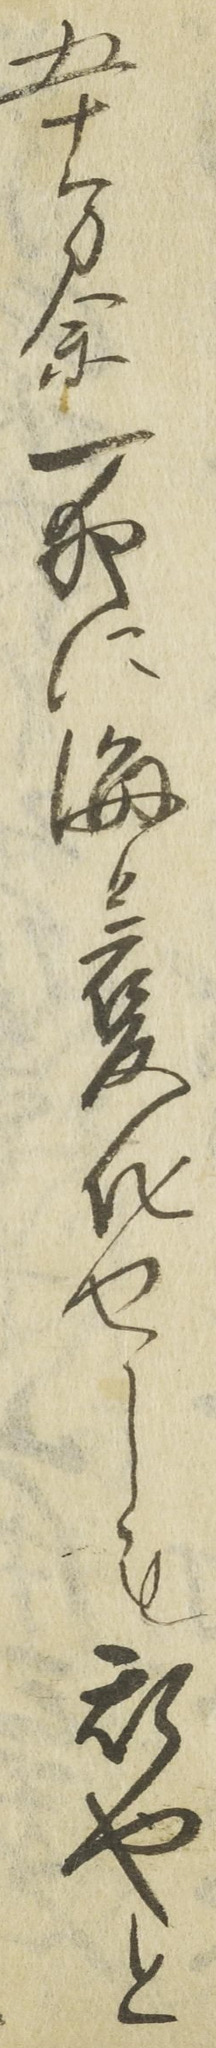五十万余一夜に海に変化せしも斯やと
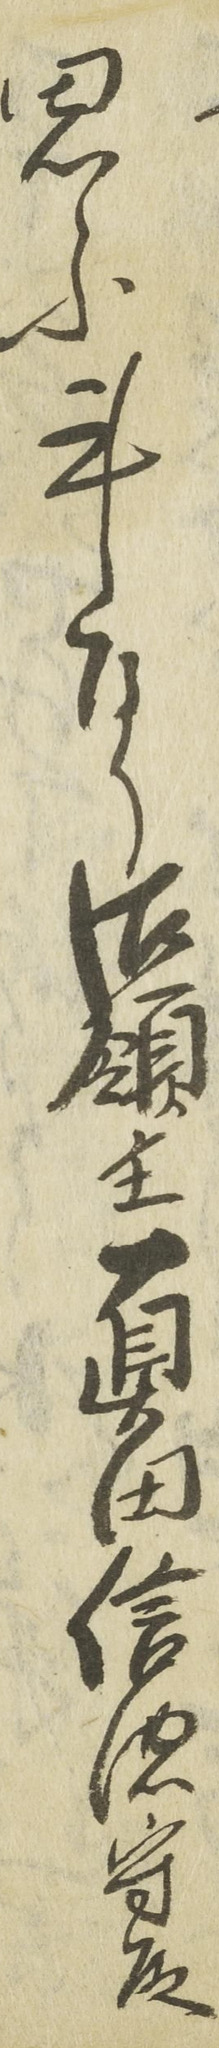思ふ計なり御領主真田信濃守殿
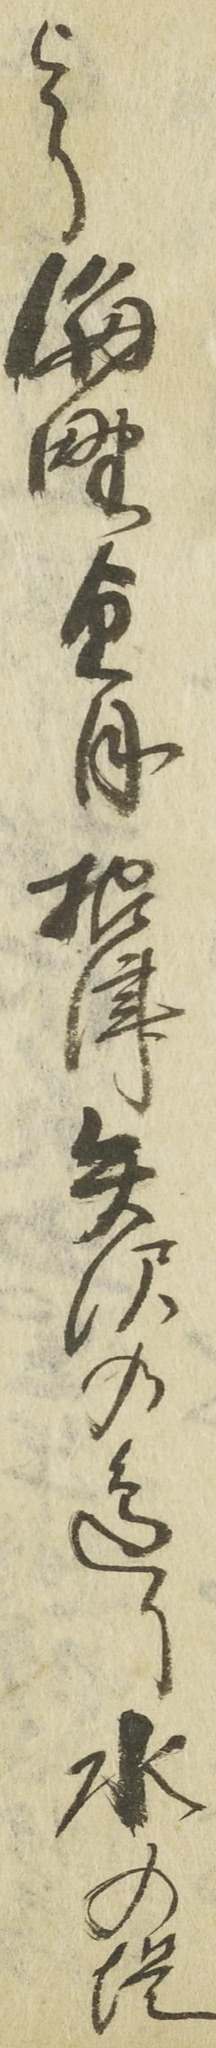より海野望月根津矢沢の辺り水の堤
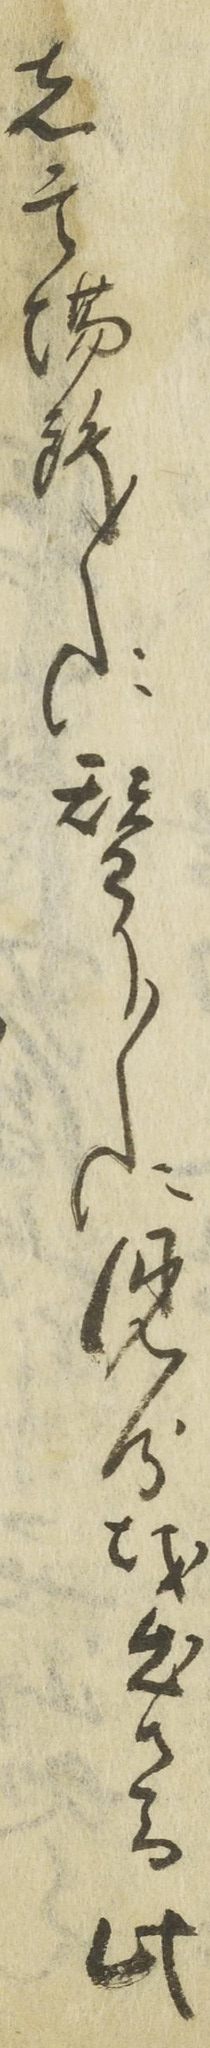は其場所〳〵に替り〳〵に見分を出さる此
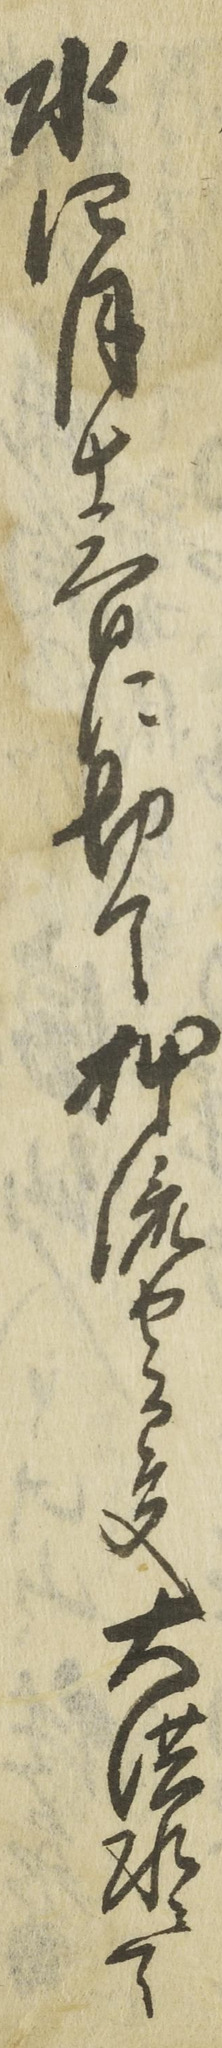水四月十三日に切て押流せる事大洪水ニて
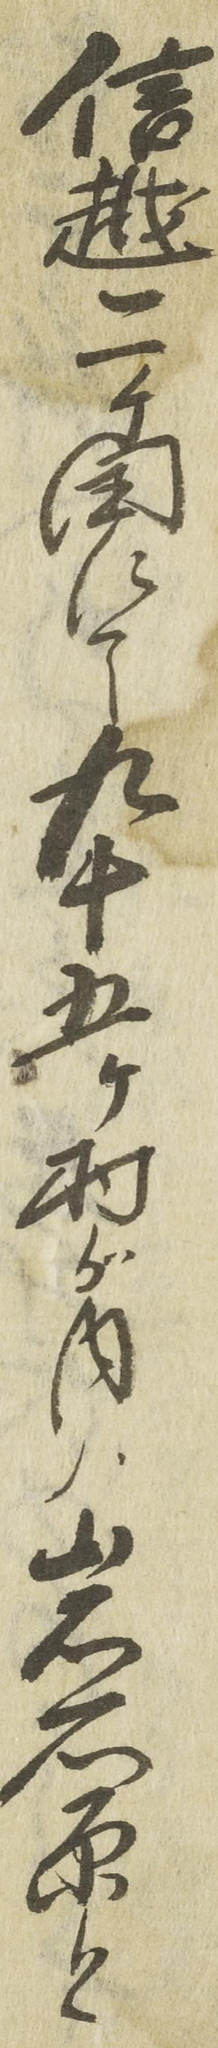信越二ヶ国にて九十五ヶ村が内は岩石原と
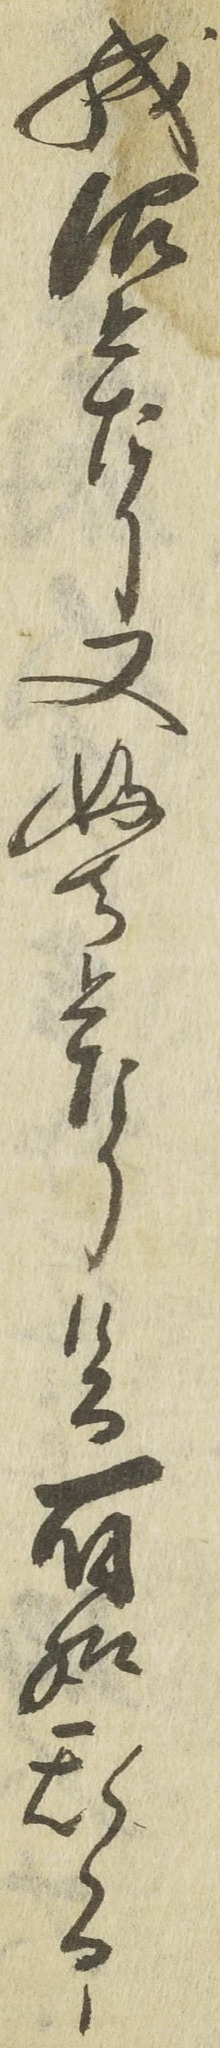成沼となり又ふちとなりける有様斯る
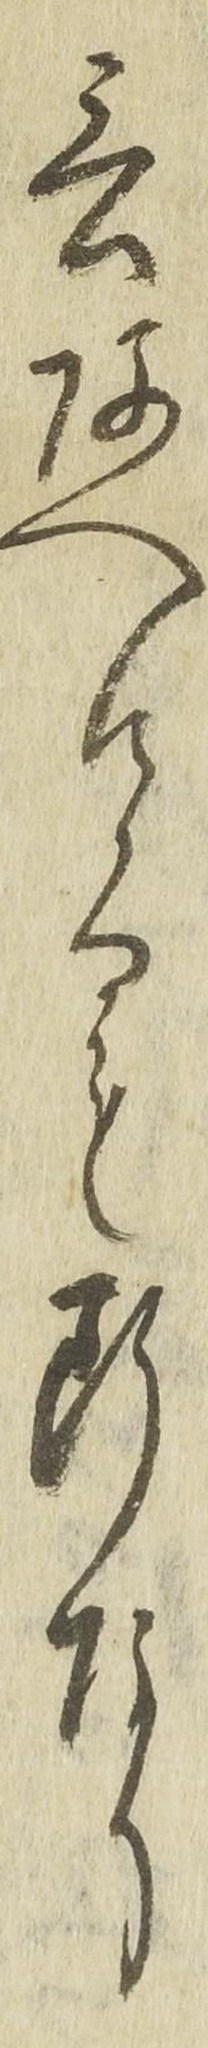言あへけるも断なり
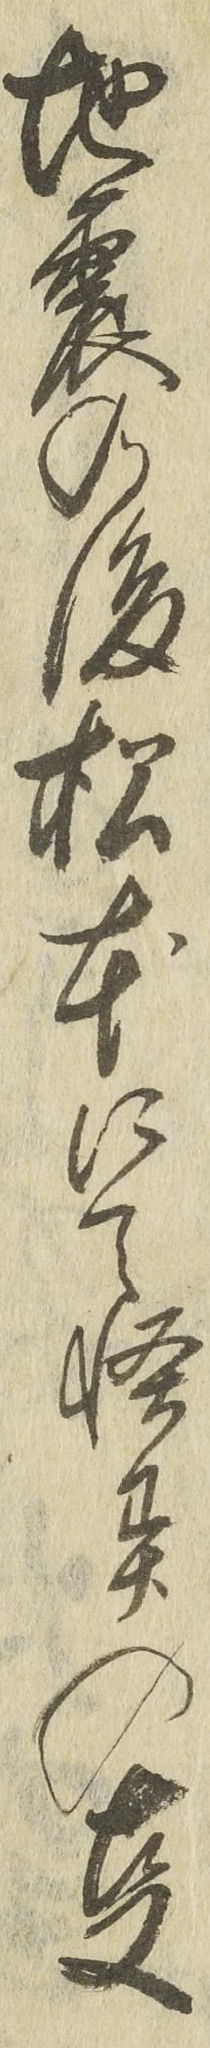地震の後松本にて怪異の事
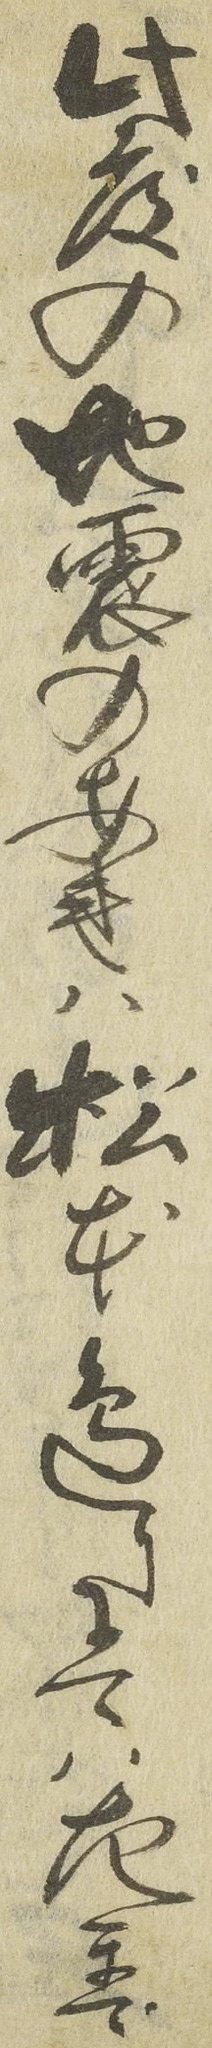此度の地震のあれは松本辺りにては左まで
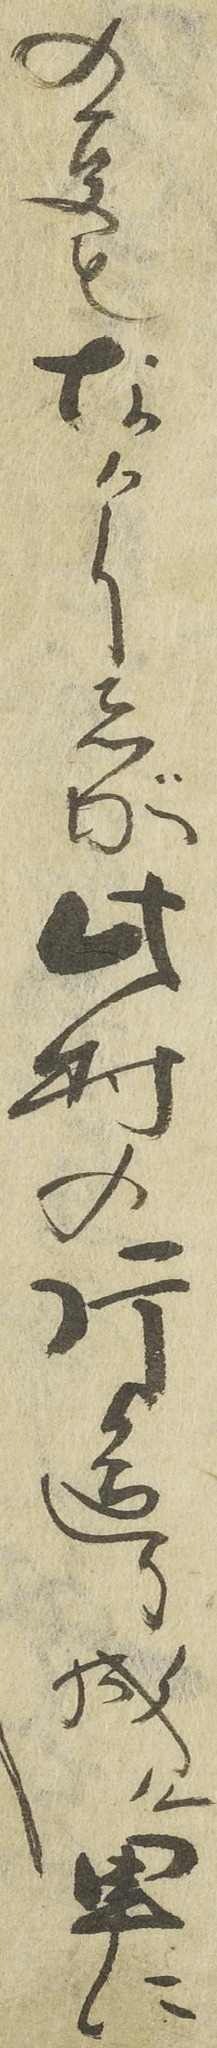の事もなかりしが此村の片辺り成ル里に
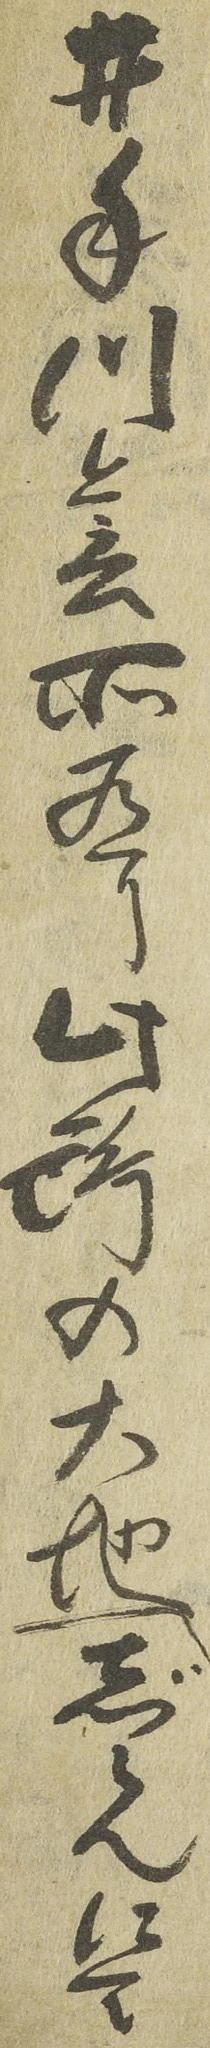井手川と言所有り此所の大地じゝんにて

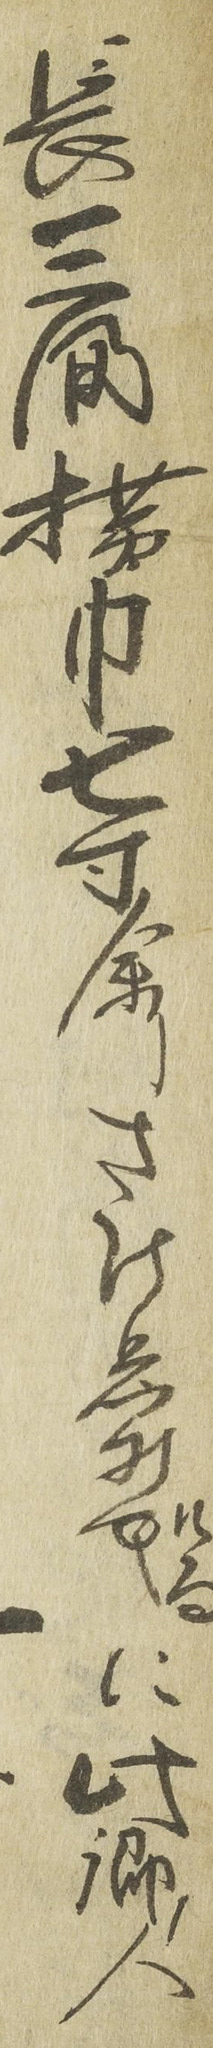長三間横巾七寸余りさけゑみけるに此郷ノ人
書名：善光寺地震聞書
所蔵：東京大学地震研究所図書室 Earthquake Research Institute Library, The University of Tokyo, JAPAN
